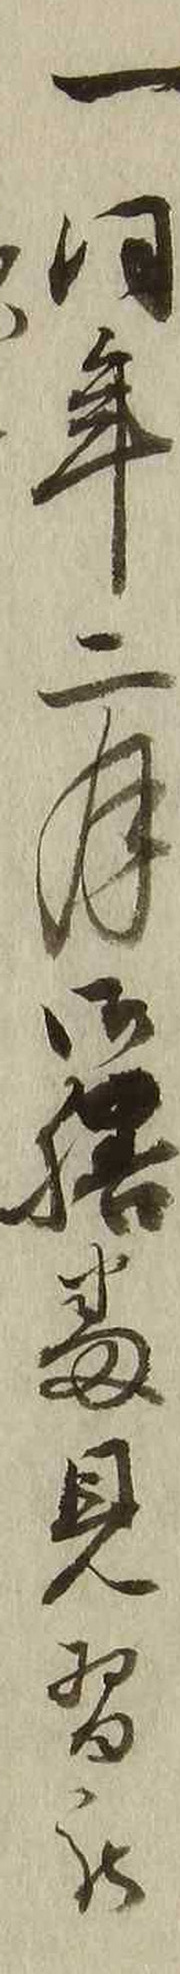一同年二月御膳番見習被
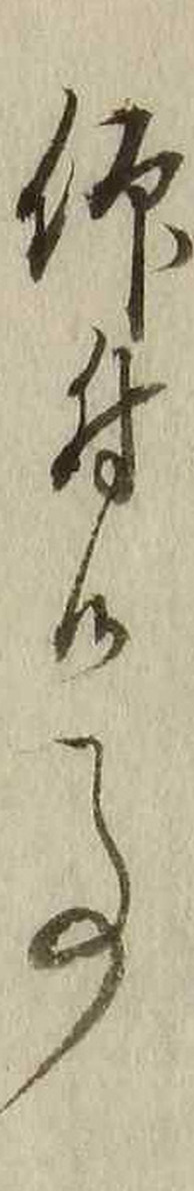仰付候事
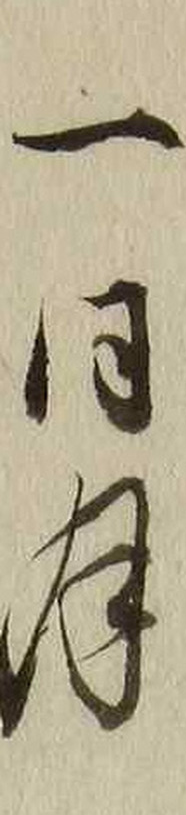一同月
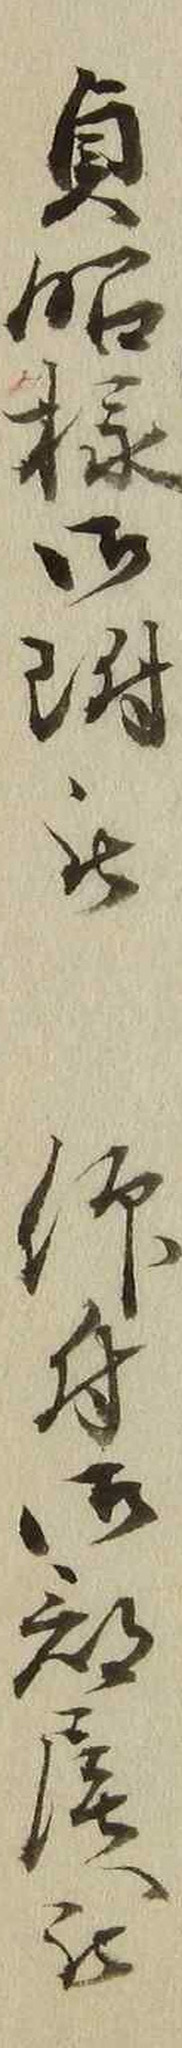貞昭様御附被仰付御部屋へ被
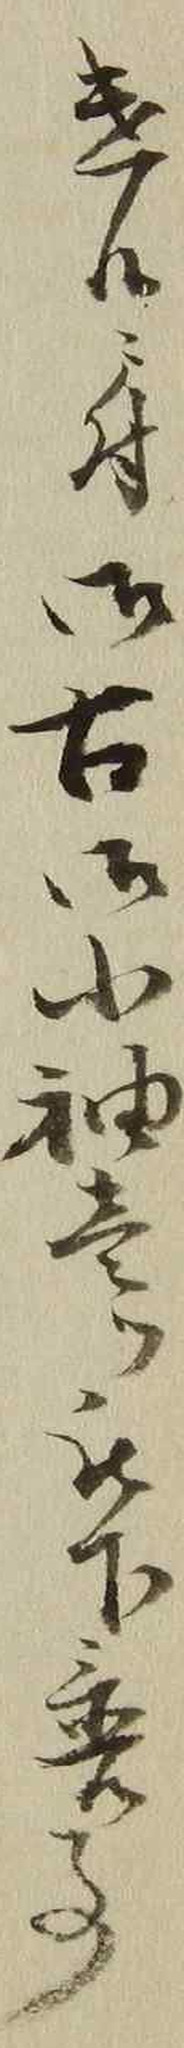遣候ニ付御古御小袖壱ツ被下置候事
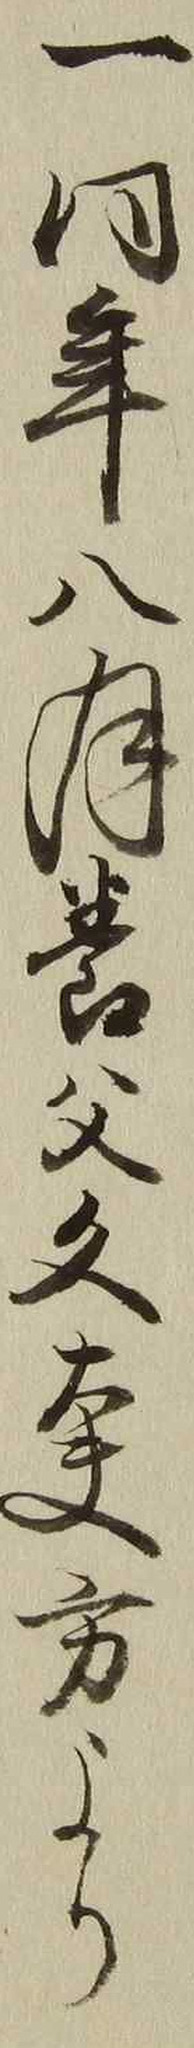一同年八月養父久大夫方より
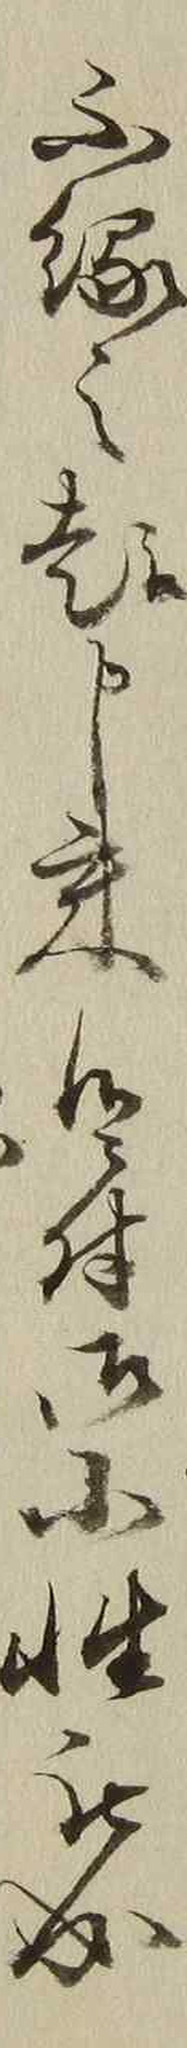不縁之趣申来候ニ付御小性被成
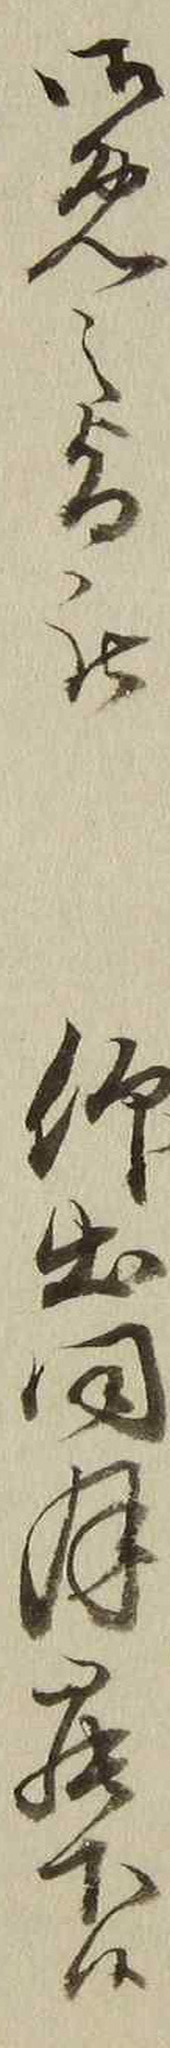御免之旨被仰出同月罷下候
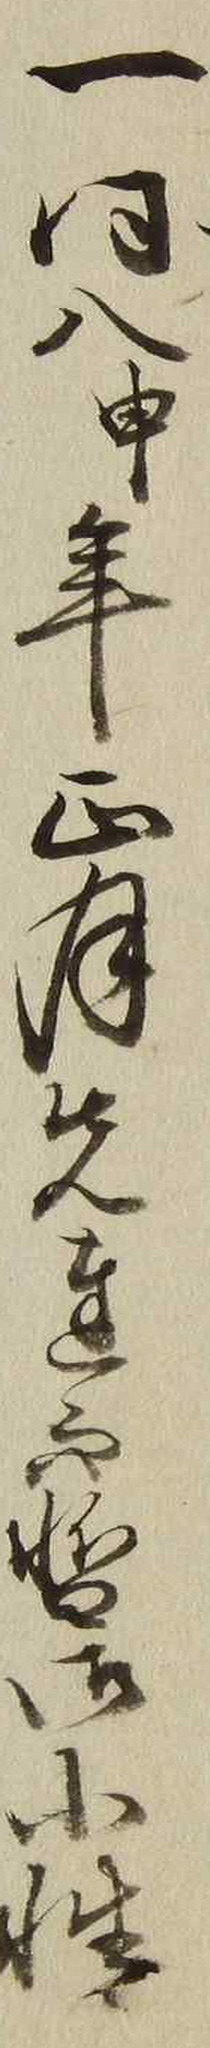一同八申年正月先達而暫御小性
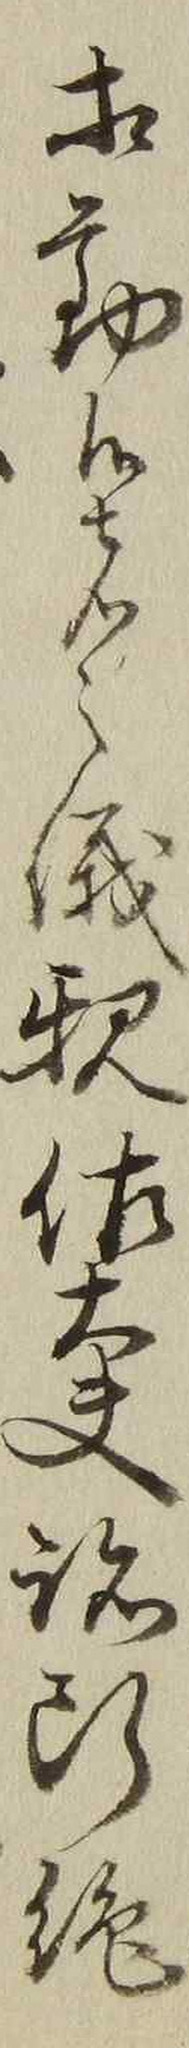相勤候者之儀親佐大夫跡断絶
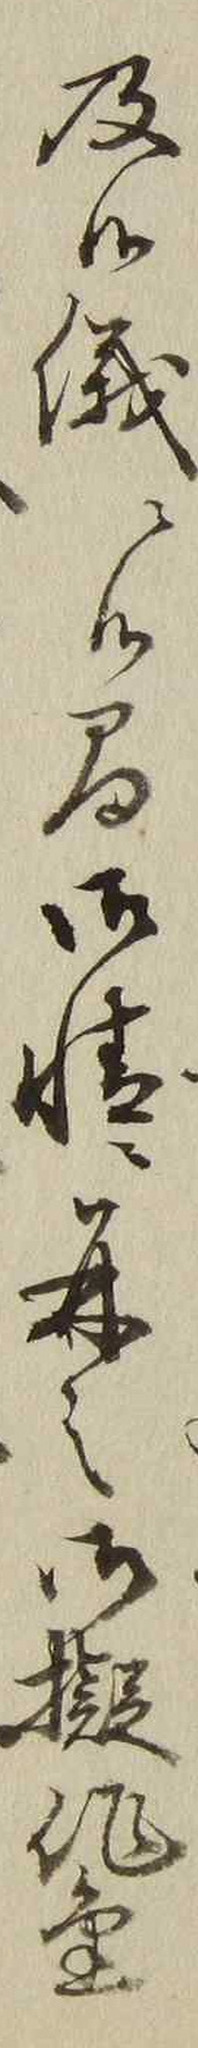及候儀ニ候間御情ニ再之御擬作金
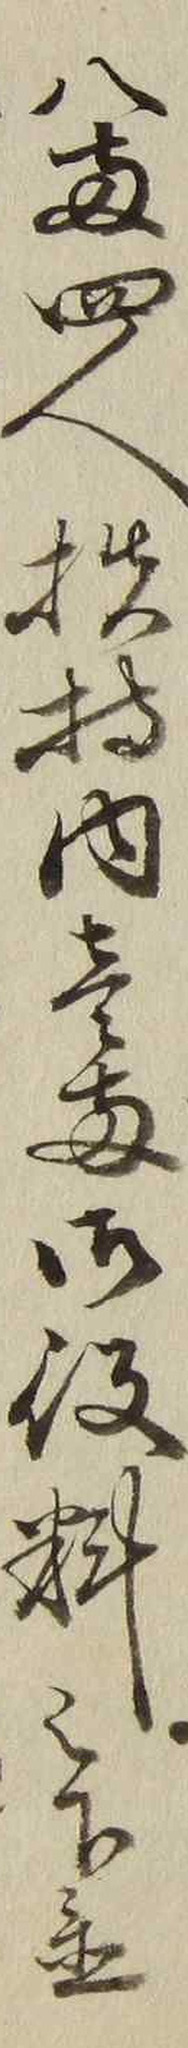八両四人扶持内壱両御役料被下置
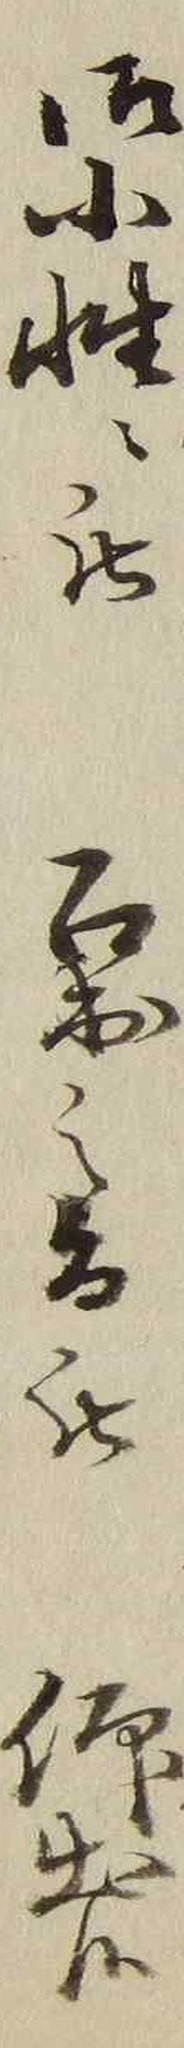御小性ニ被召出之旨仰出候
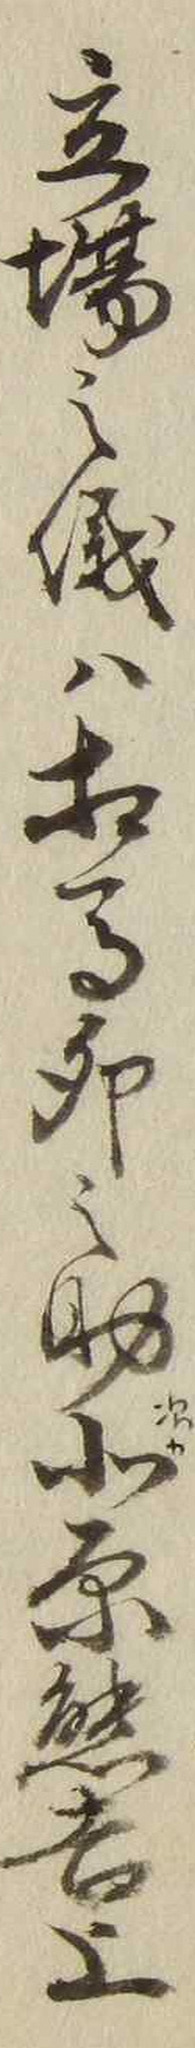立場之儀ハ相馬卯之助北原熊吉上

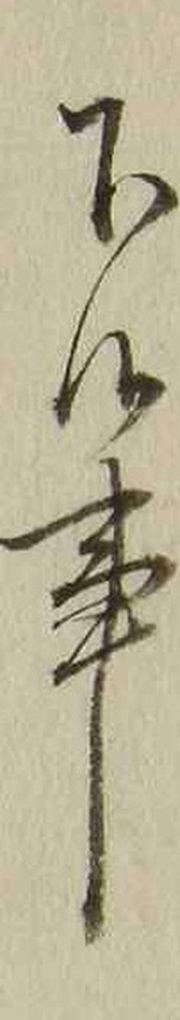下候事
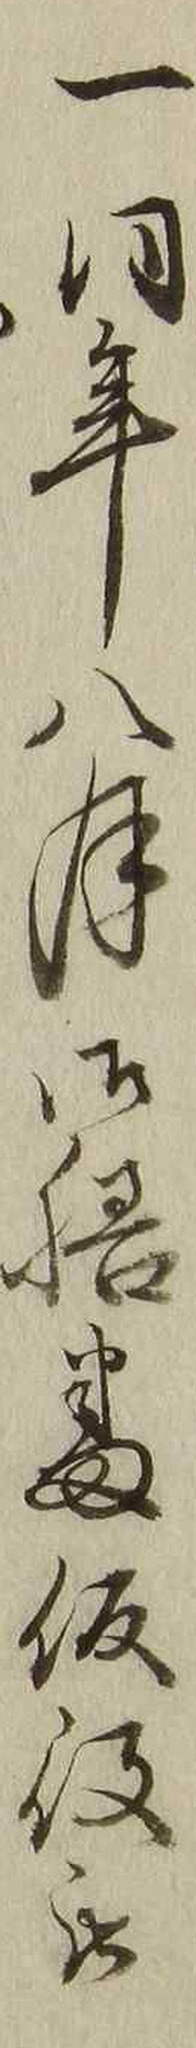一同年八月御膳番仮役被
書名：諸士系譜　巻之36　は之部4
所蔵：会津若松市立会津図書館
